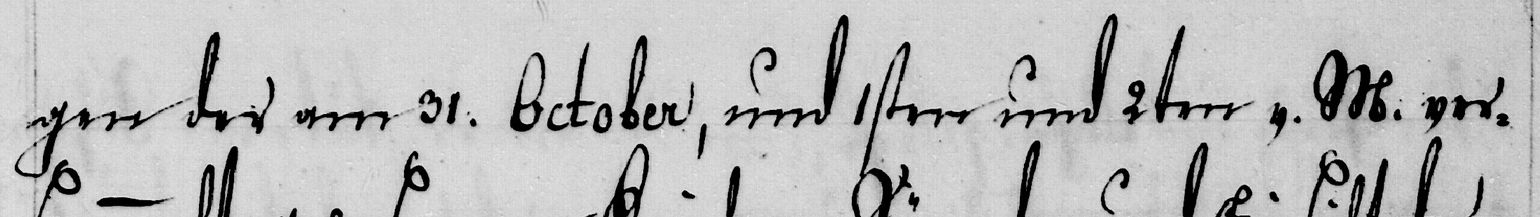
gen der am 31. October, und 1sten und 2ten v. M. ver¬
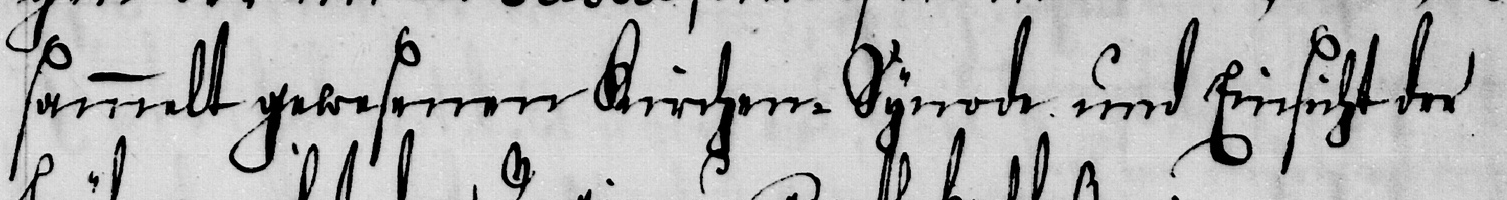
sammelt gewesenen Kirchen-Synode und Einsicht der
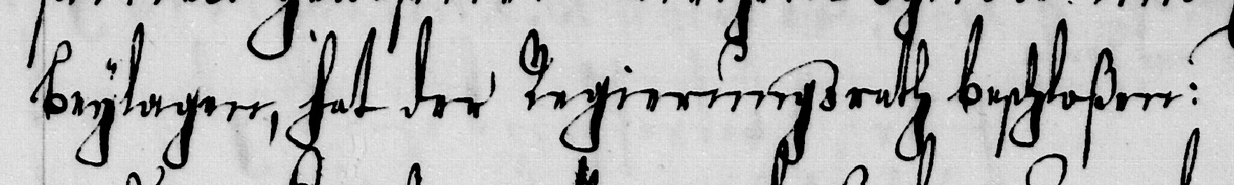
Beylagen, hat der Regierungsrath beschloßen:
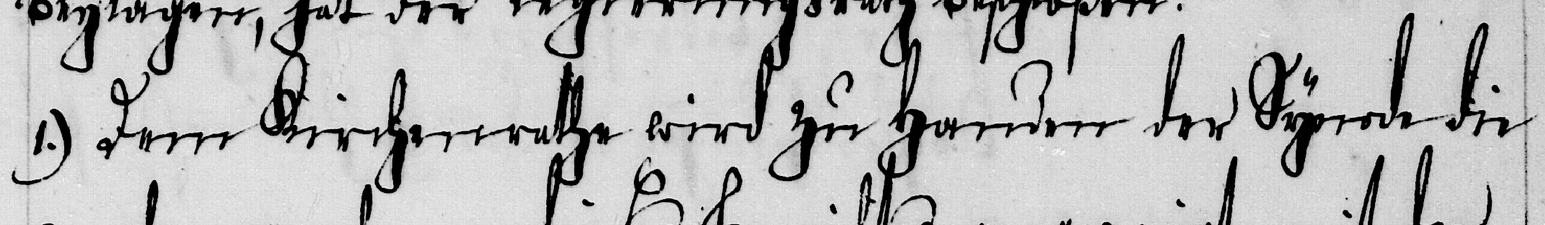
1.) Dem Kirchenrathe wird zu Handen der Synode die
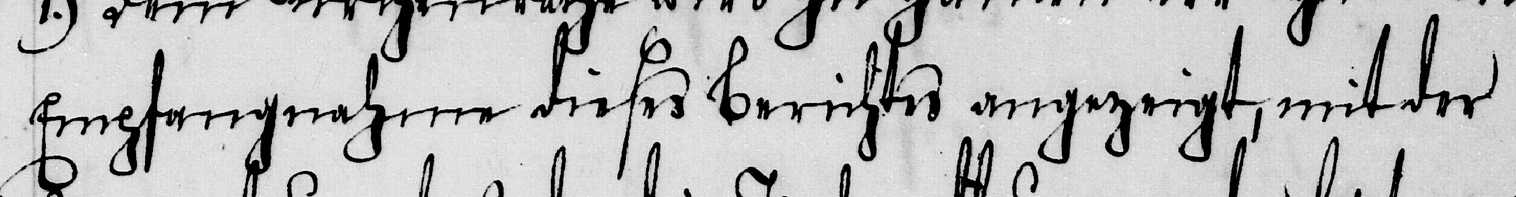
Empfangnahme dieses Berichtes angezeigt, mit der
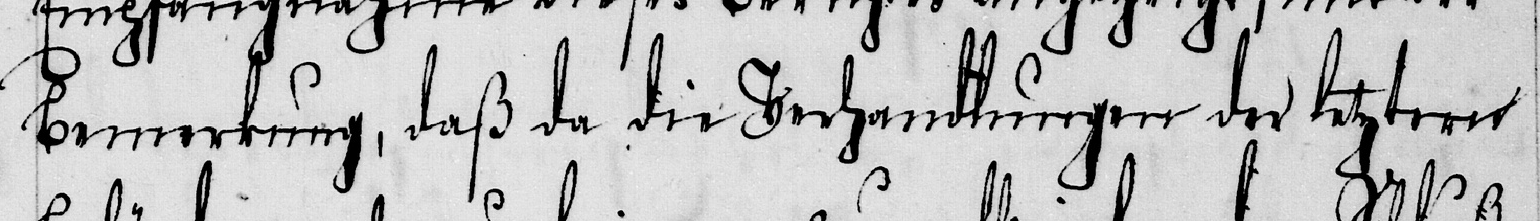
Bemerkung, daß da die Verhandlungen der letztern
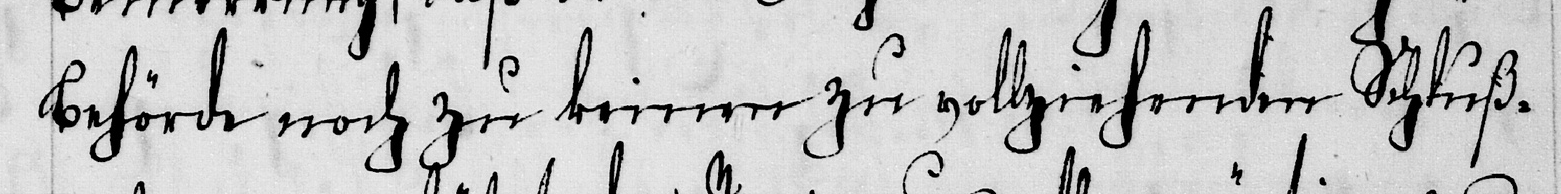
Behörde noch zu keinen zu vollziehenden Schluß¬
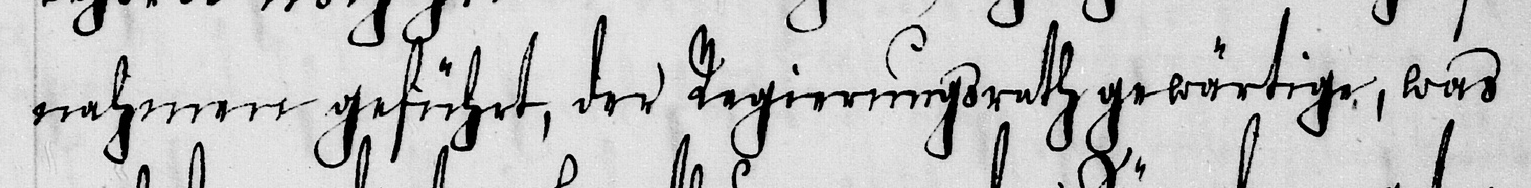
nahmen geführt, der Regierungsrath gewärtige, was
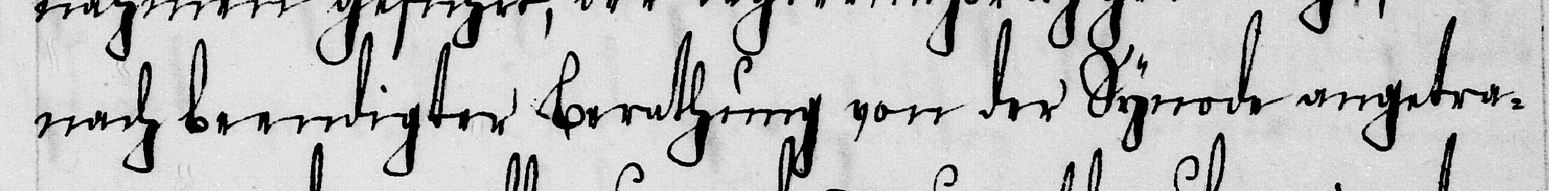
nach beendigter Berathung von der Synode angetra¬
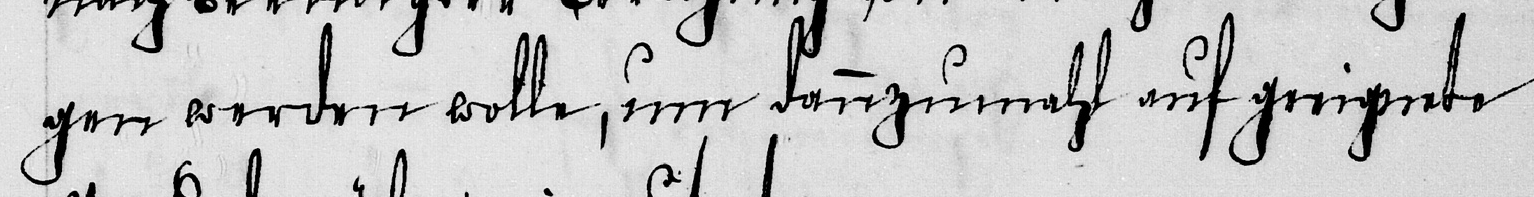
gen werden wolle, um dannzumahl auf geeignete
